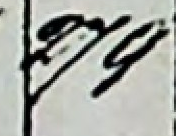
279
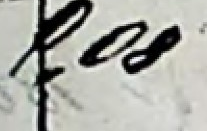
0,08
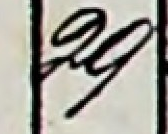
29
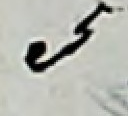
5
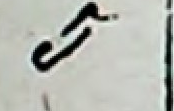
5
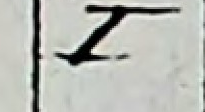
I
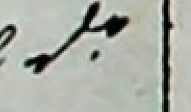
do
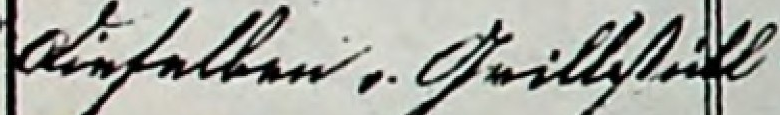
Diefelben v. Grillstübl
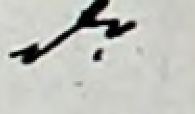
do
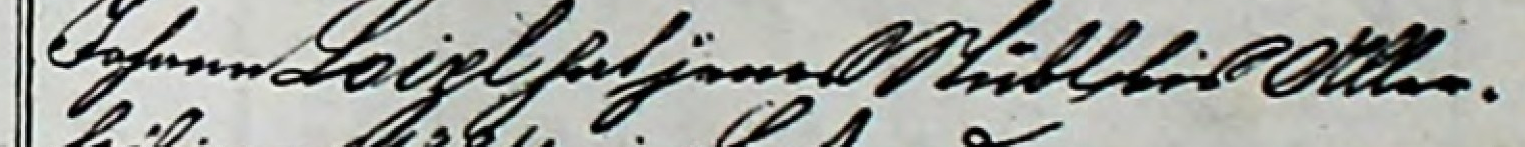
Johann Loipl hat jenes Stübl bis Aller„
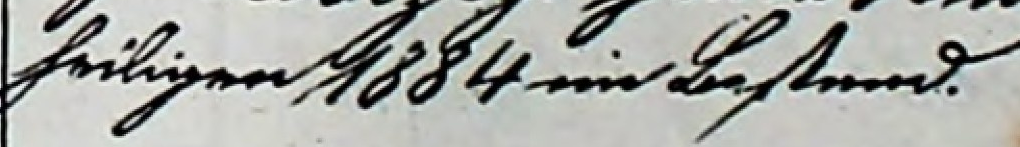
heiligen 1884 im Bestand.
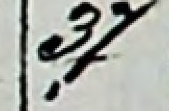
37
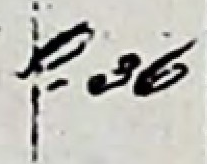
0,36
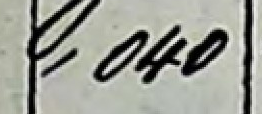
0,040
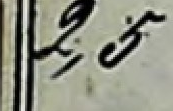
2,5
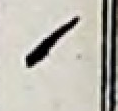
1
